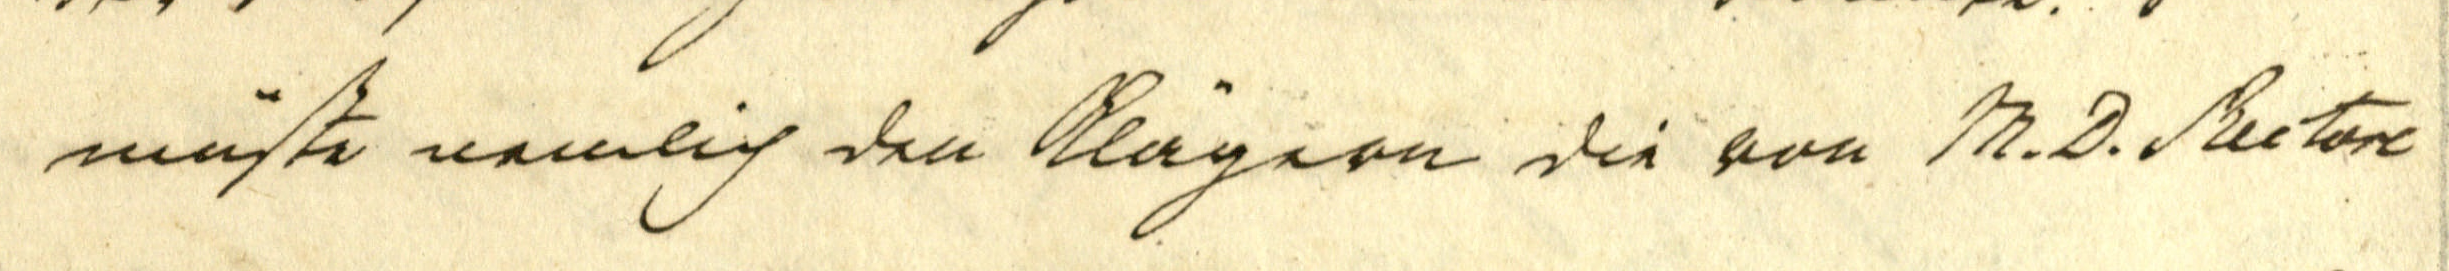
müsste nemlich den Klägern die von M. D. Rectore
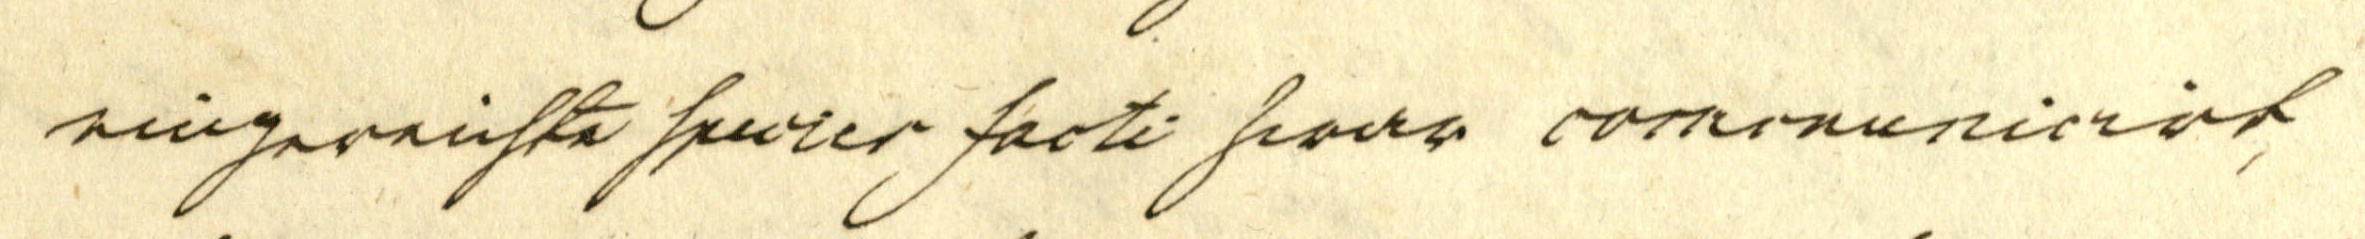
eingereichte Species Facti zwar communicirt,
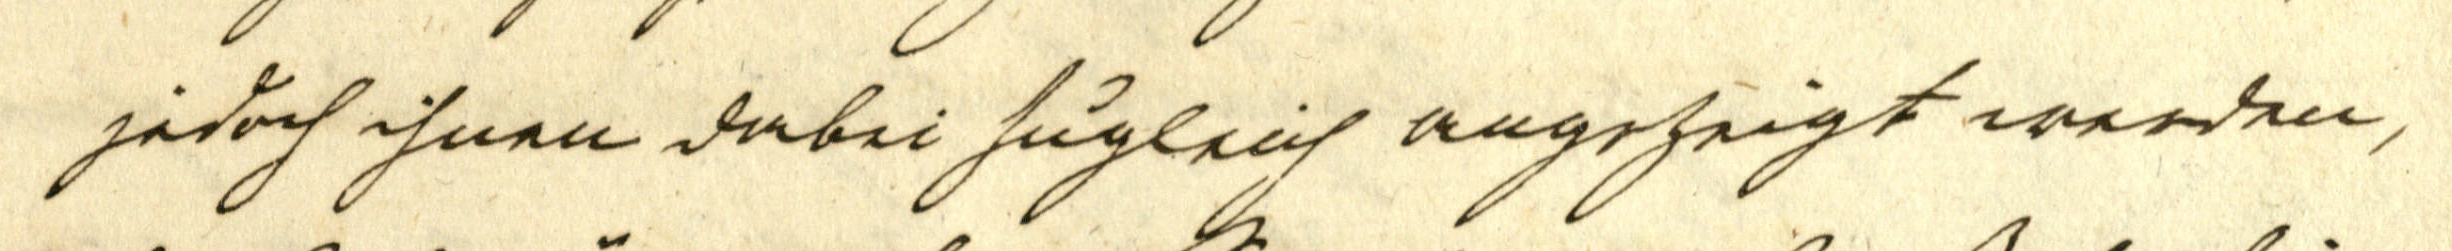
jedoch ihnen dabei zugleich angezeigt werden,
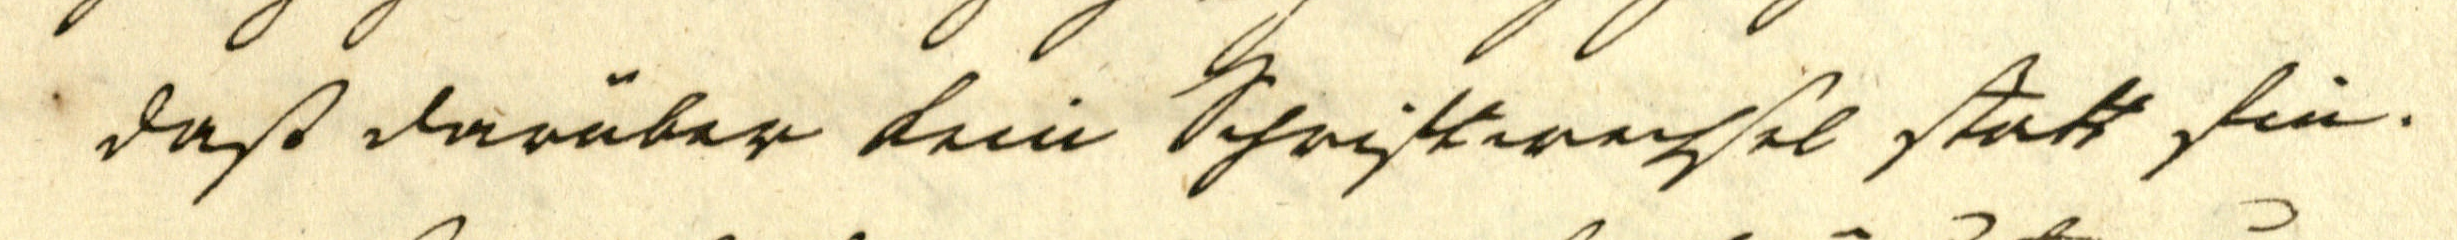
daß darüber kein Schriftwechsel statt fin¬
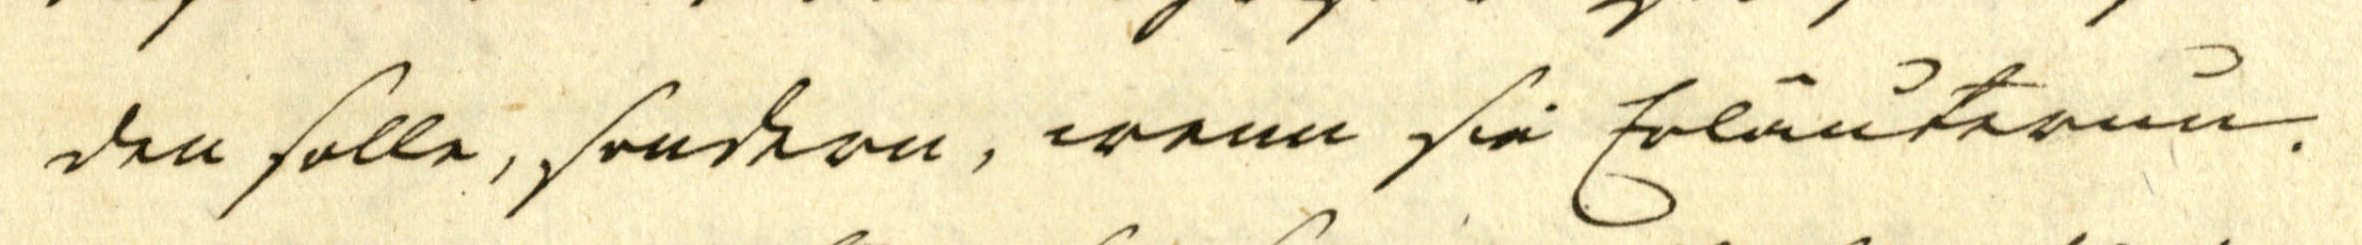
den solle, sondern, wenn sie Erläuterun¬
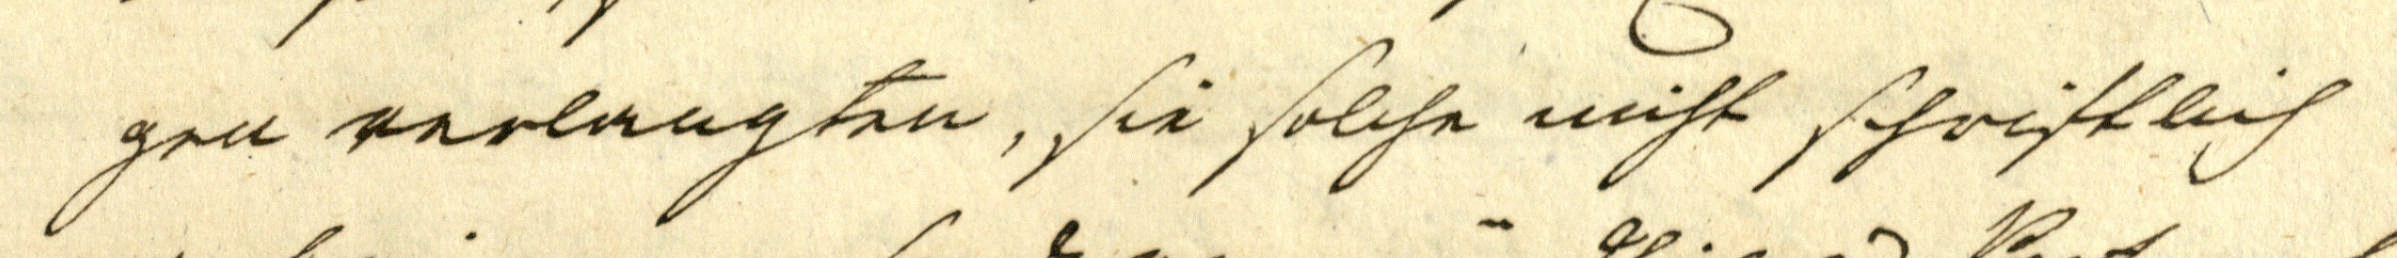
gen verlangten, sie solche nicht schriftlich
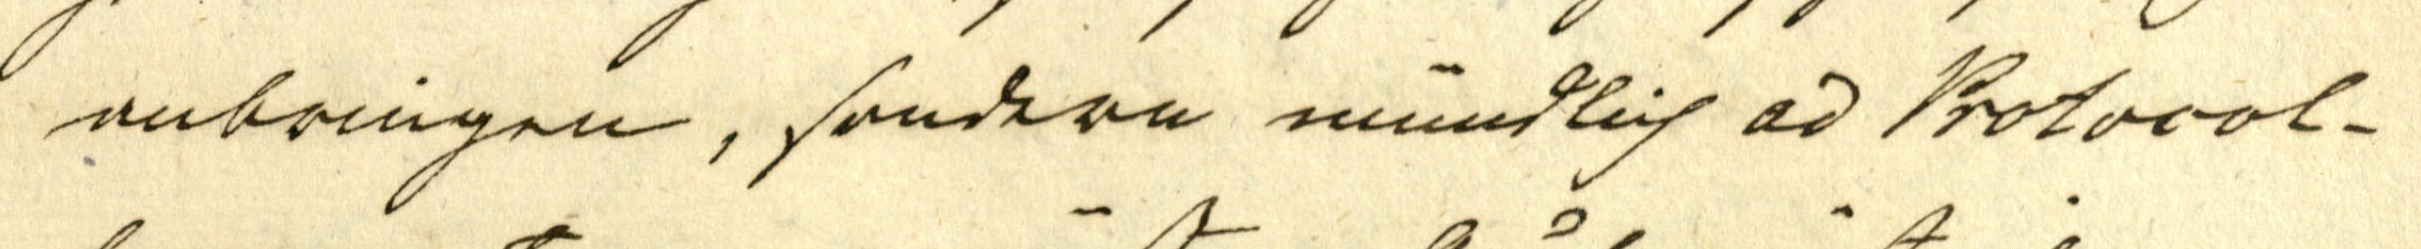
anbringen, sondern mündlich ad Protocol¬
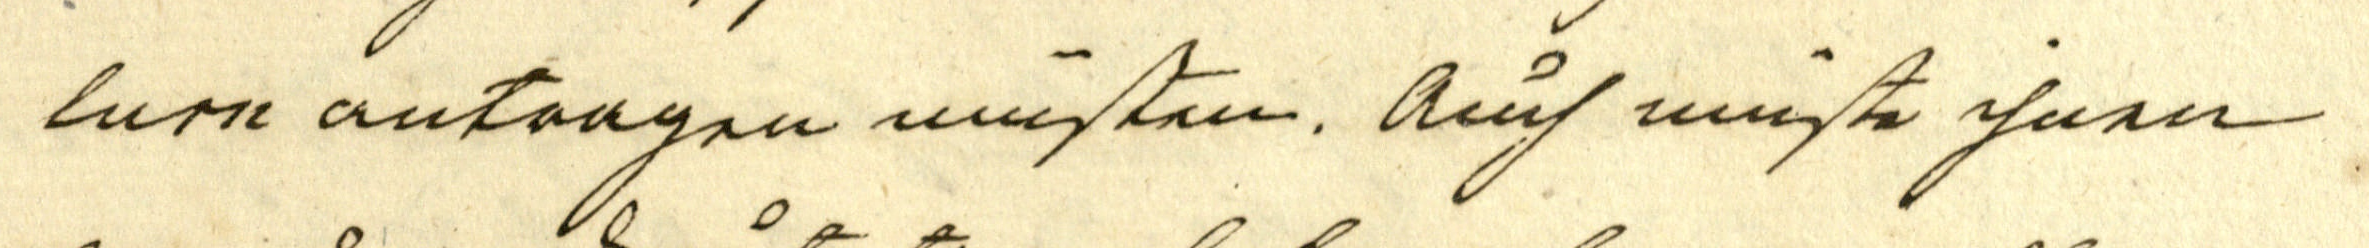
lum antragen müssten. Auch müßte ihnen
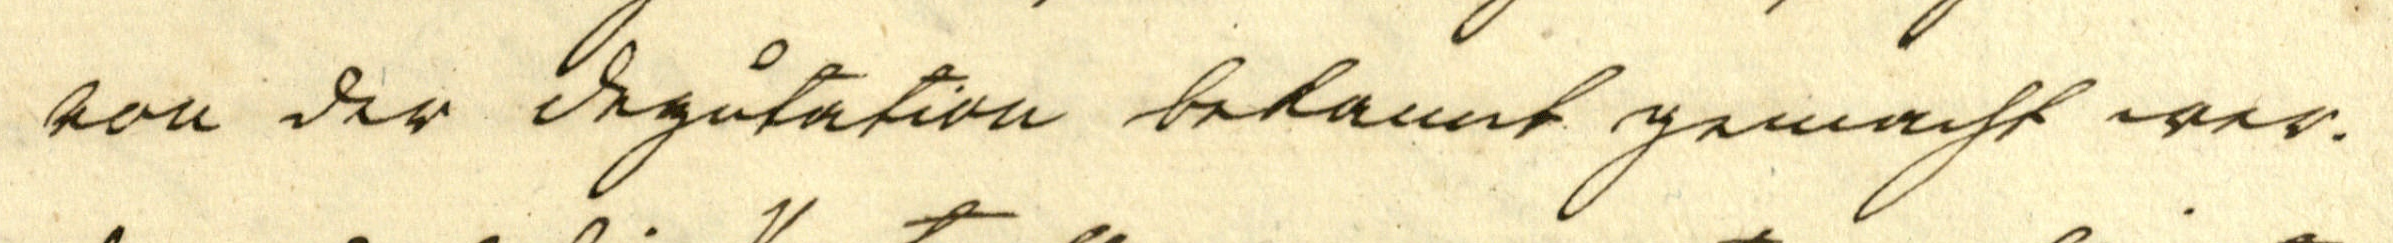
von der Deputation bekannt gemacht wer¬
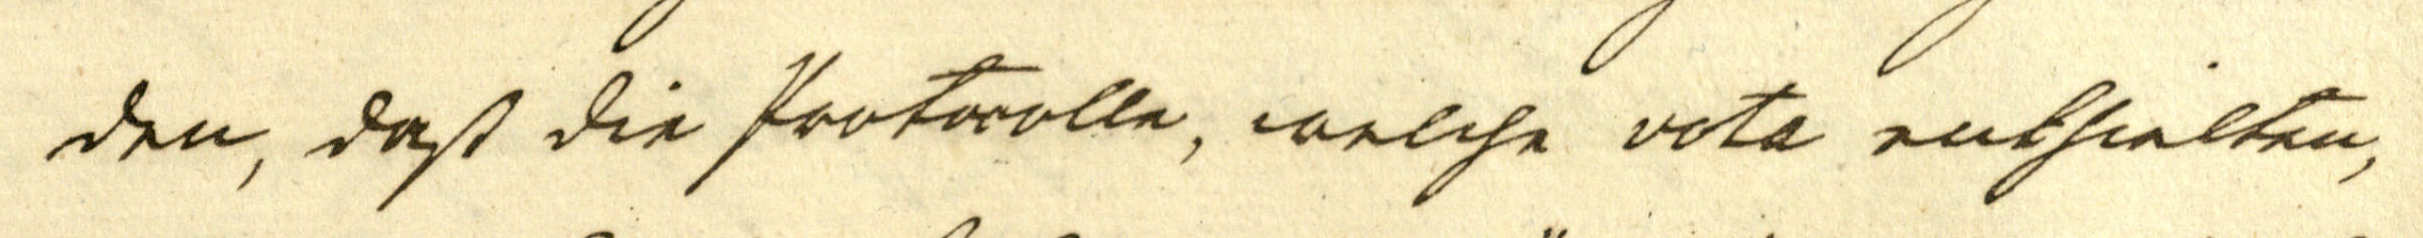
den, daß die Protocolle, welche vota enthielten,
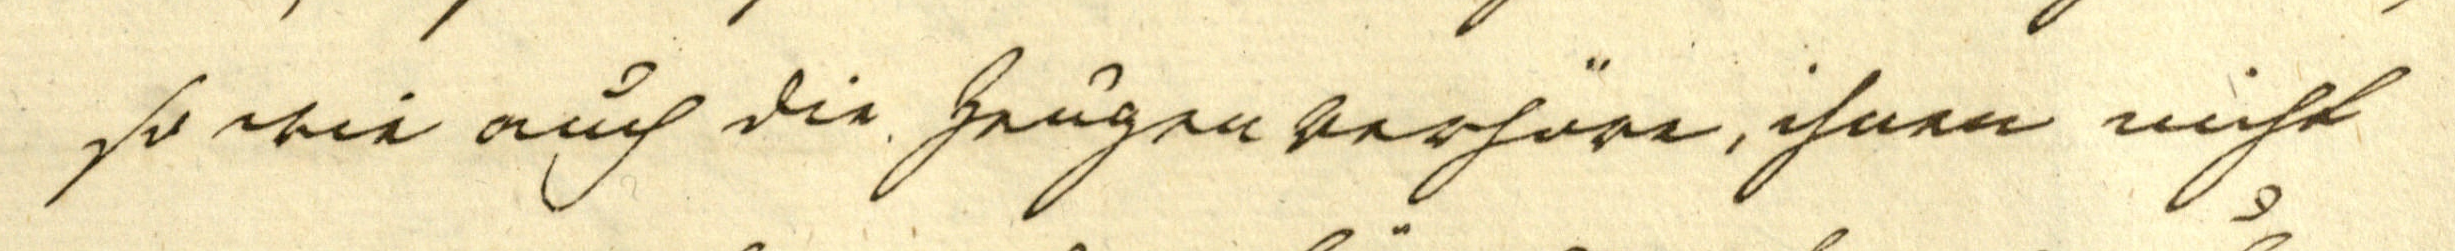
so wie auch die Zeugen verhöre, ihnen nicht
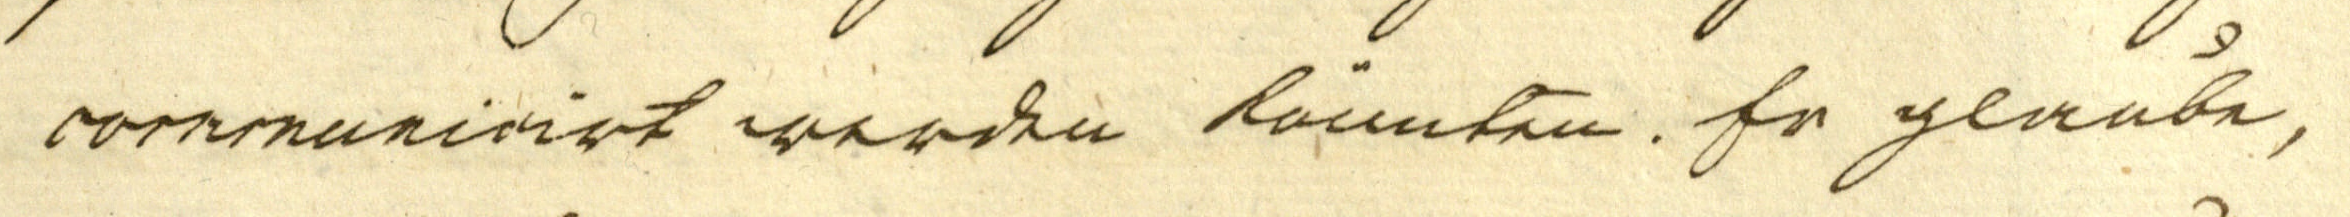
communicirt werden könnten. Er glaube,
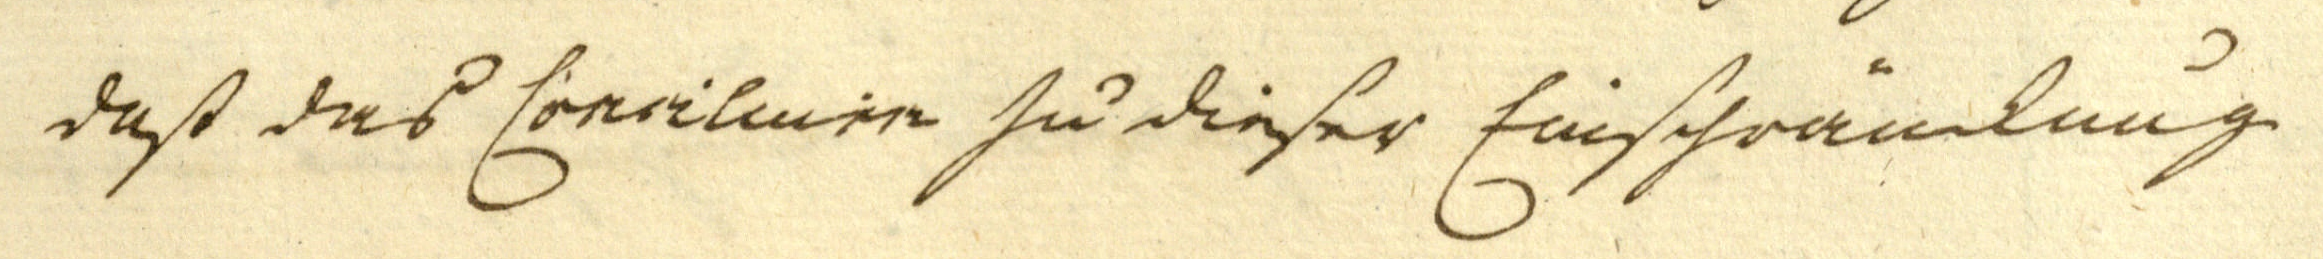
daß das Concilium zu dieser Einschränckung
